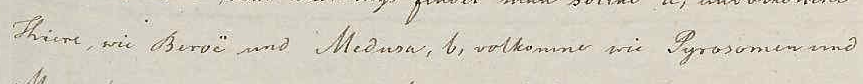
Thiere, wie Beroë und Medusa, b, volkomne wie Pyrosomen und
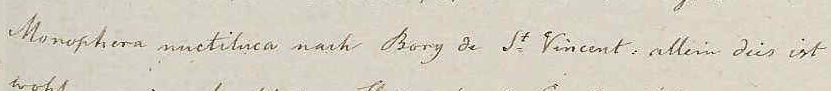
Monophera nuctiluca nach Bory de St Vincent: allein dies ist
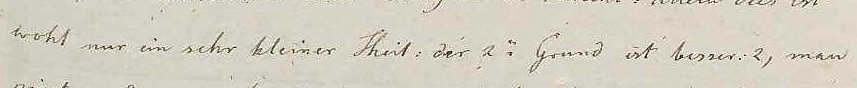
wohl nur ein sehr kleiner Theil: der 2￼ Grund ist besser: 2, man
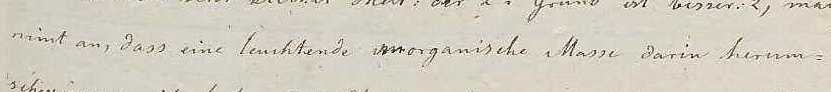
nimt an, dass eine leuchtende anorganische Masse darin herum-
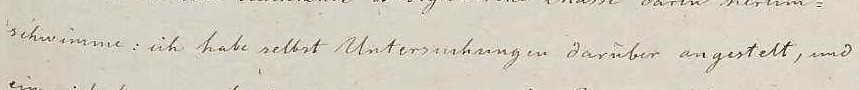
schwimme: ich habe selbst Untersuchungen darüber angestelt, und
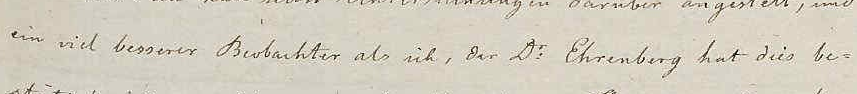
ein viel besserer Beobachter als ich, der Dr Ehrenberg hat dies be-
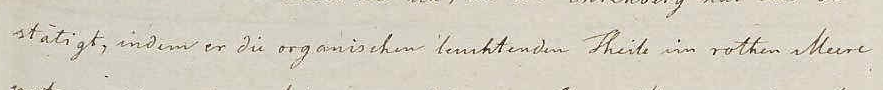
stätigt, indem er die organischen leuchtenden Theile im rothen Meere
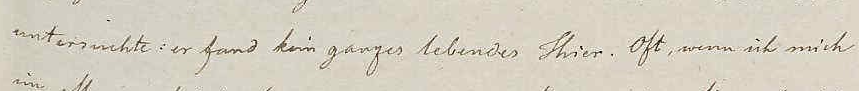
untersuchte: er fand kein ganzes lebendes Thier. Oft, wenn ich mich
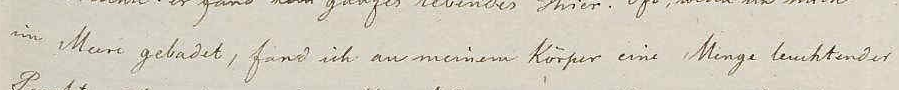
im Meere gebadet, fand ich an meinem Körper eine Menge leuchtender
